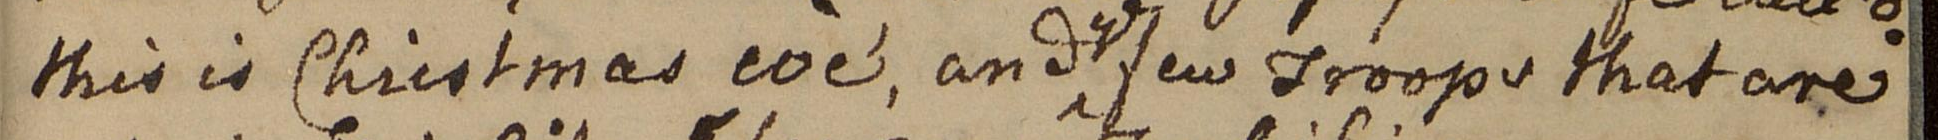this is Christmas eve, and ^y^e few Troops that are
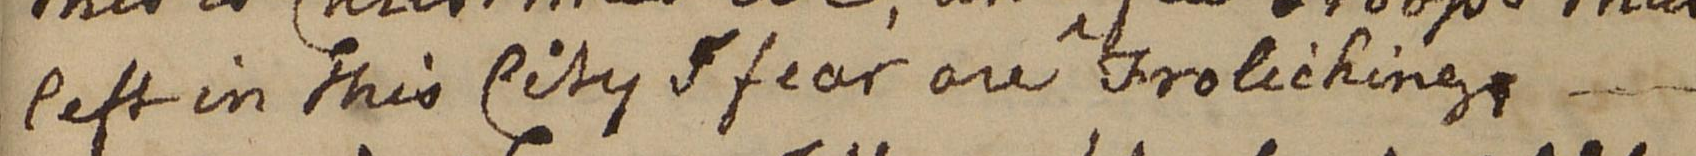left in this City I fear are Frolickings-
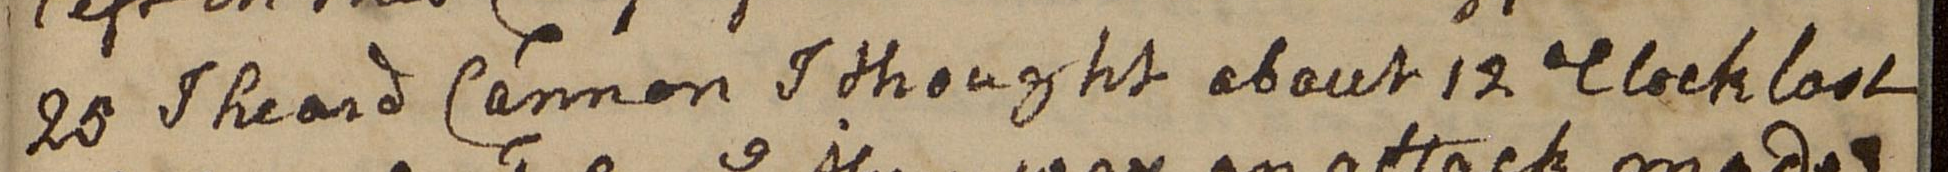25 I heard Cannon I thought about 12 ^o Clock last
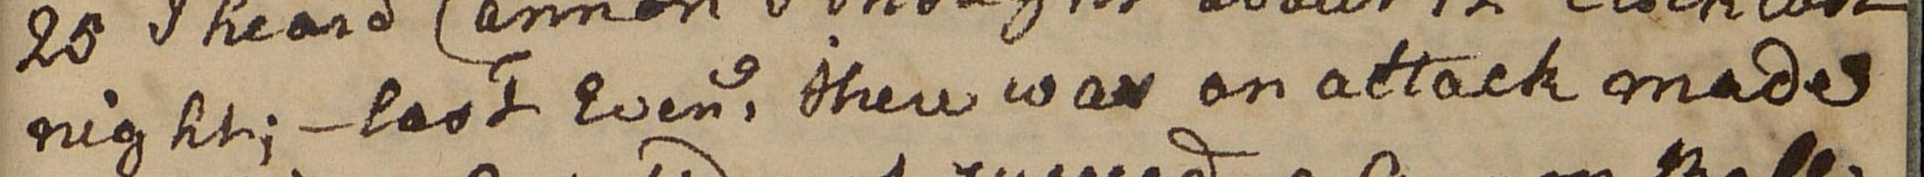night;- last Even^g. there was an attack made
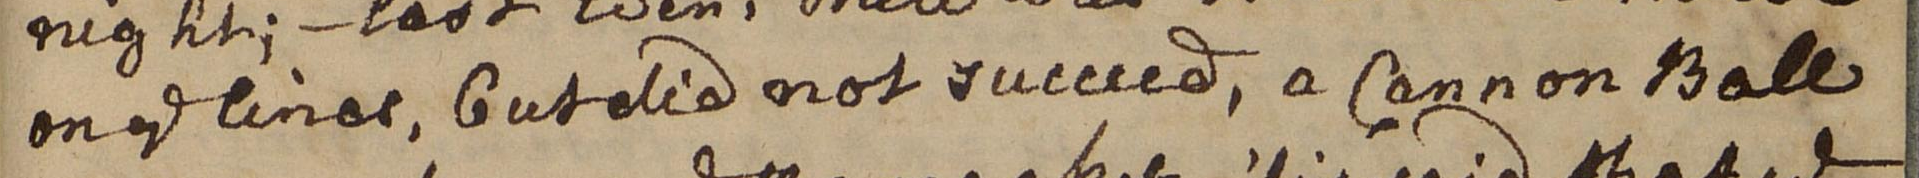on y^e lines, but did not succeed, a Cannon Ball
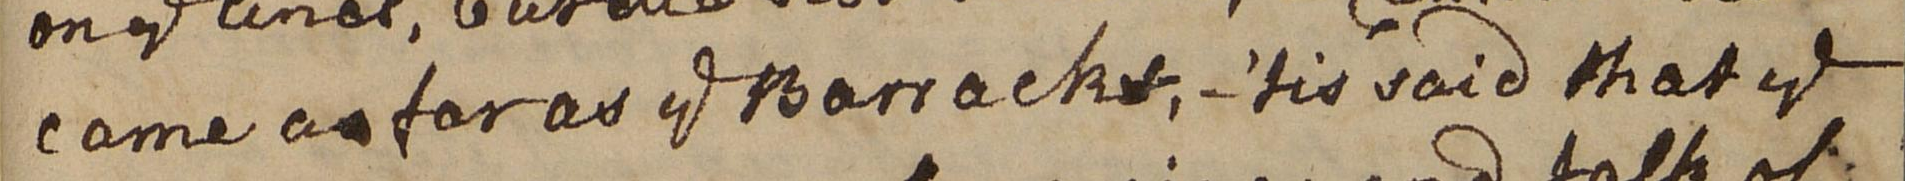came as far as y^e Barracks,- 'tis said that y^e
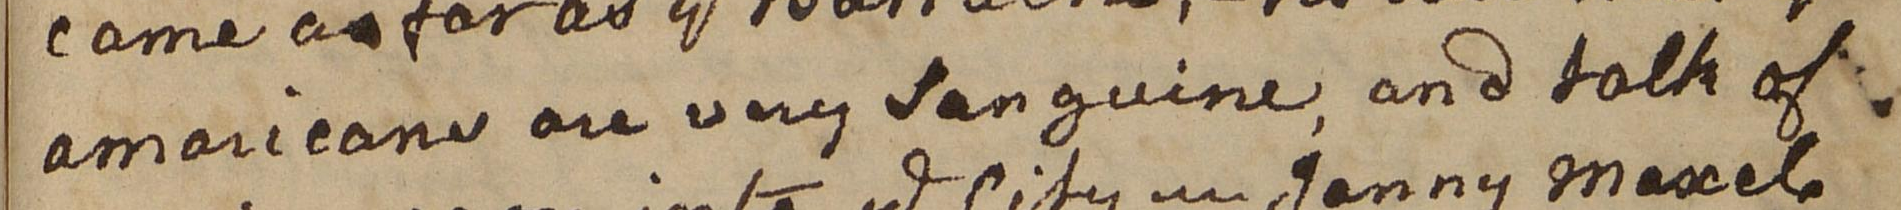amaricans are very Sanguine, and talk of
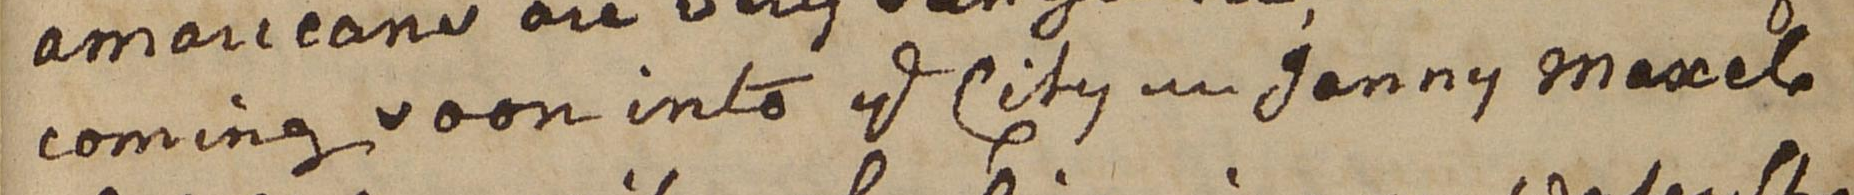coming soon into y^e City - Janny Maxel
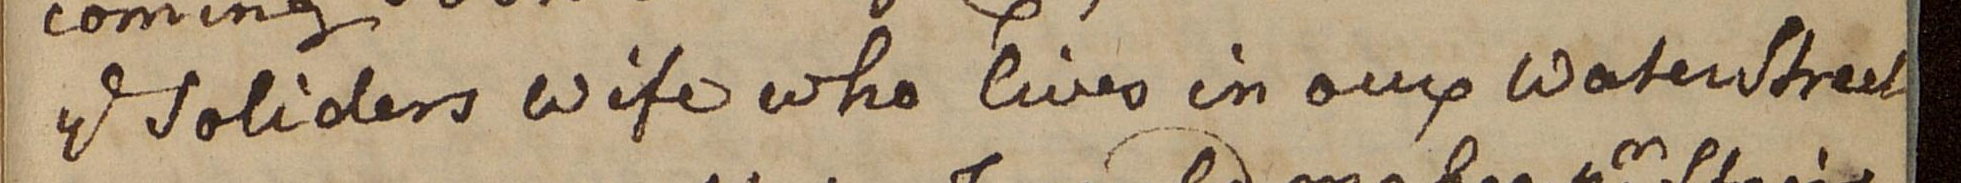y^e Soliders Wife who lives in our Water Street
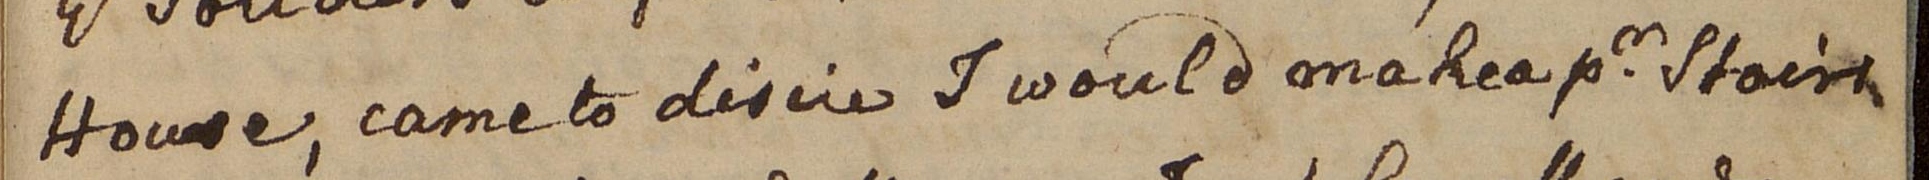House, came to disire I would makea p^r. Stair
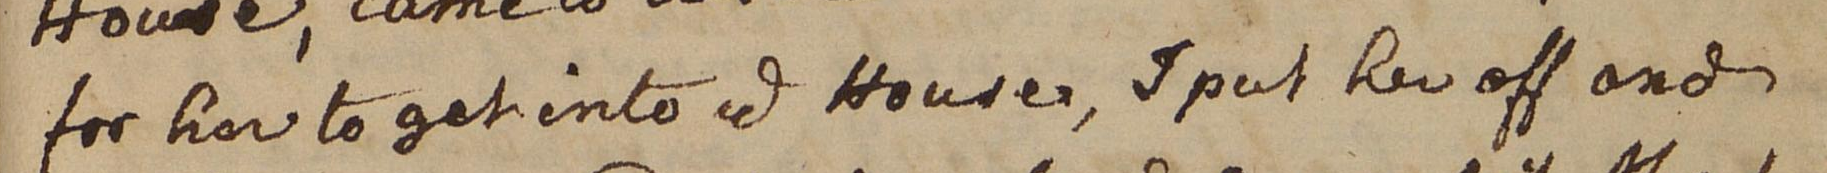for her to get into y^e House, I put her off and
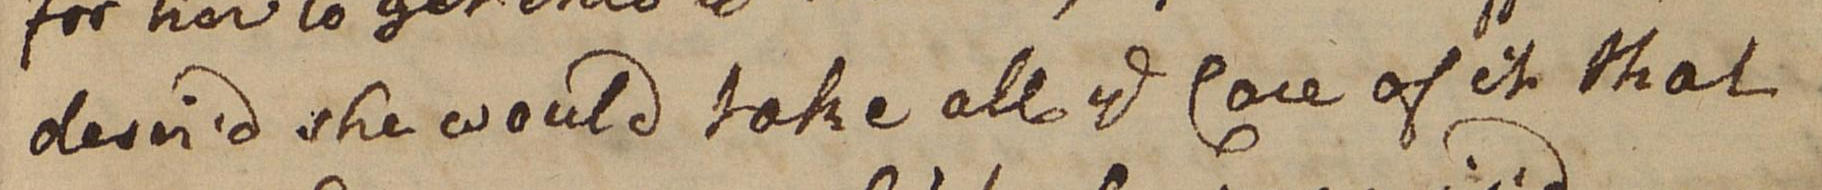desir'd she would take all y^e Care of it that
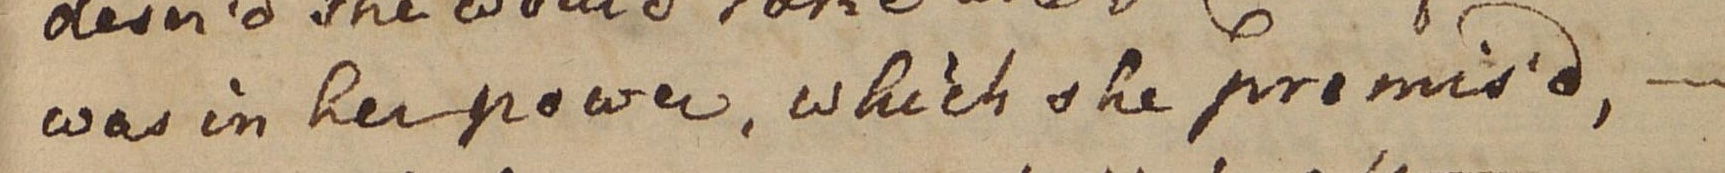was in her power, which she promis'd,-
